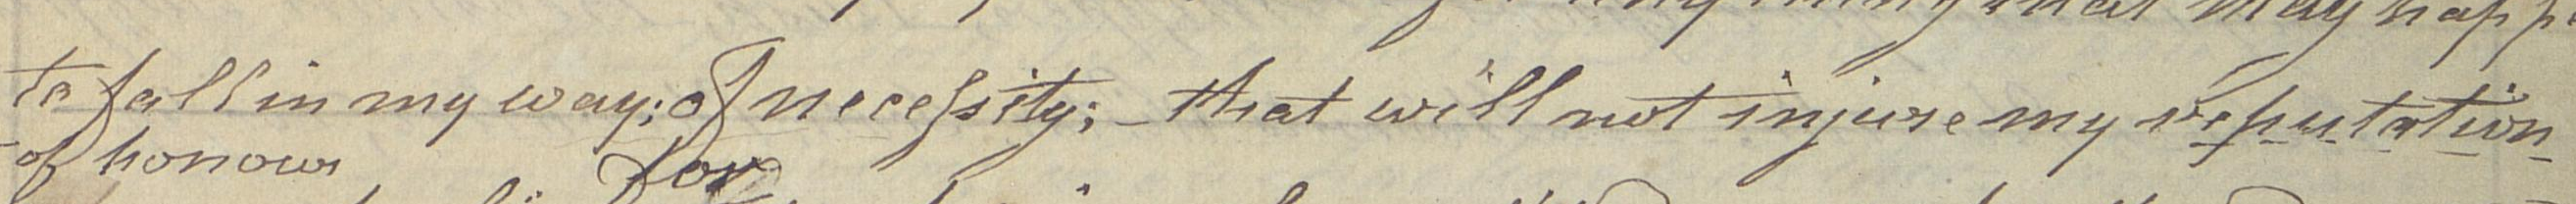to fall in any way of necessity; that will not injure my reputation
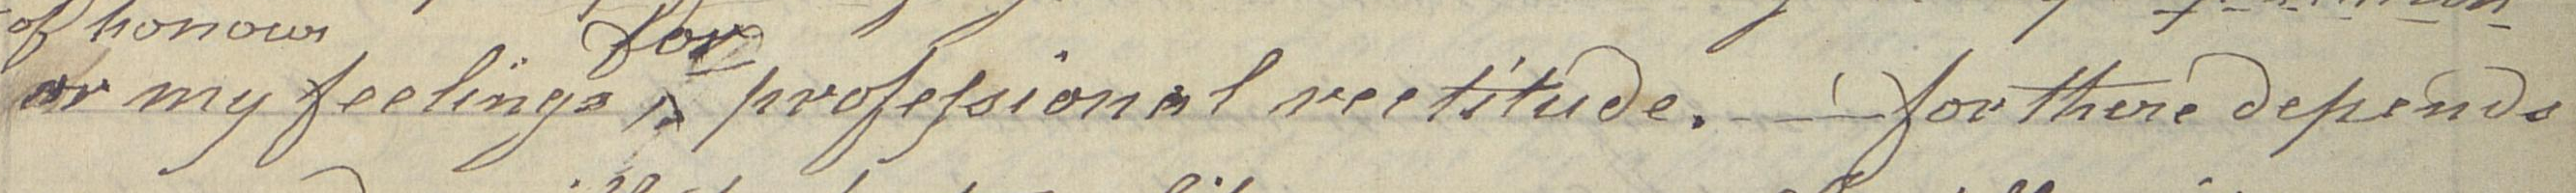or my feelings ^ profession at rectitude. for there depends
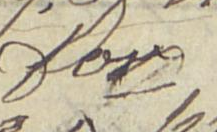for
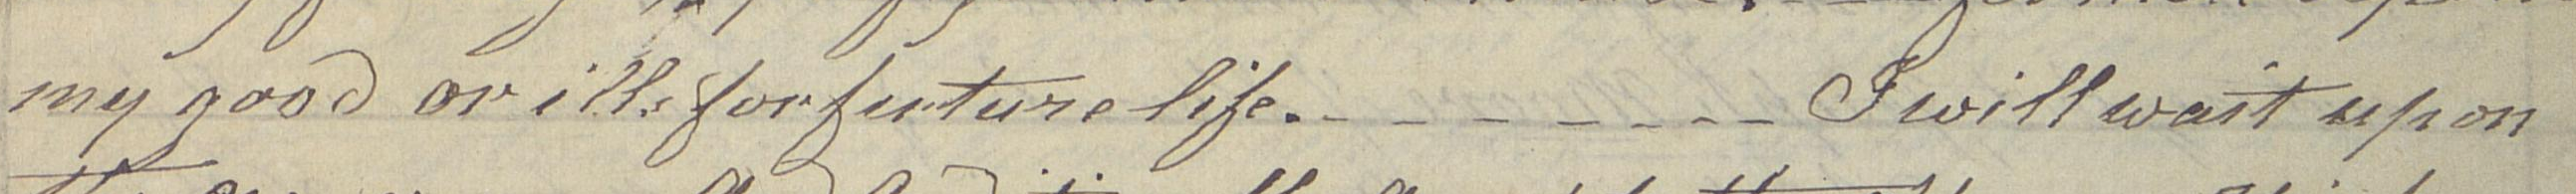my good or ills for future life. I will wait upon
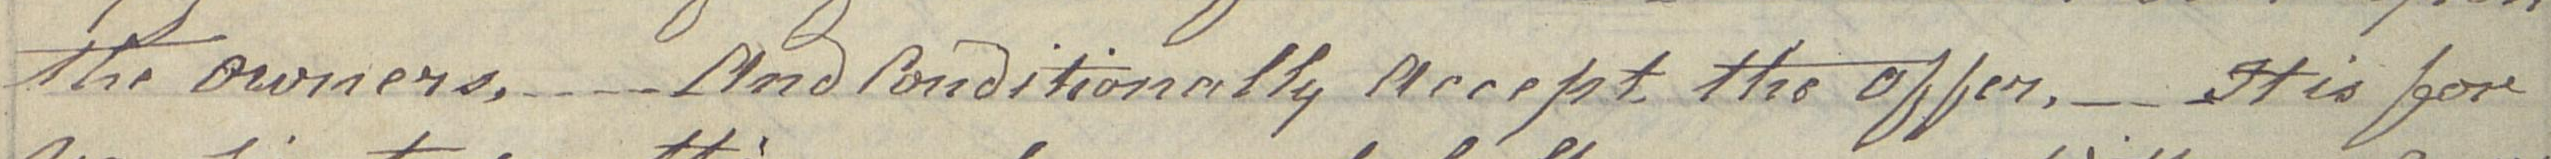the owners. And conditionally accept the Offer, His for
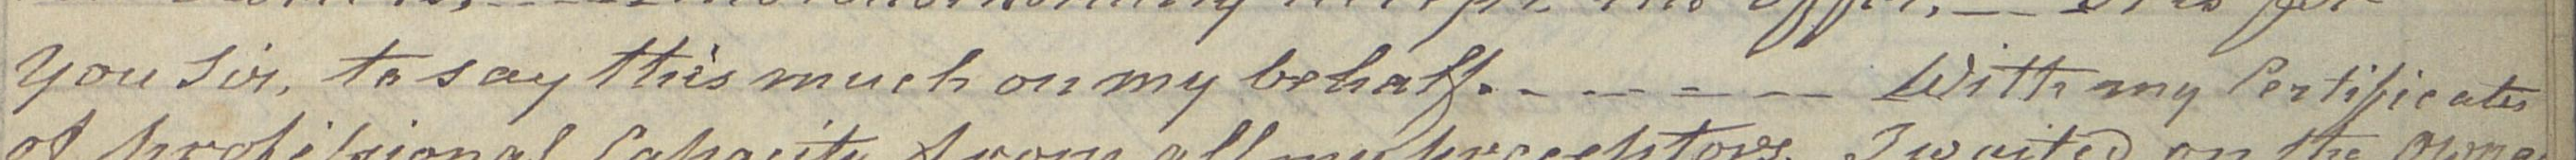you Sir, to say this much on my behalf. With my Participates
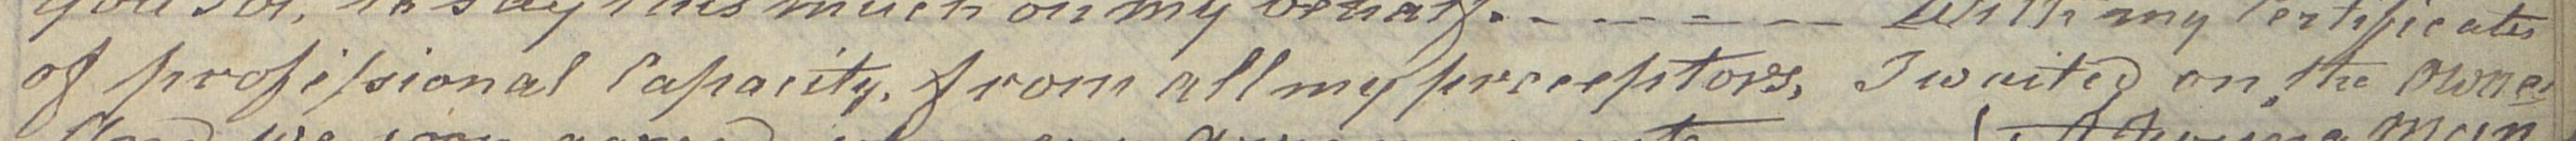of professional Capacity from all my preceptors, I waited on the own-
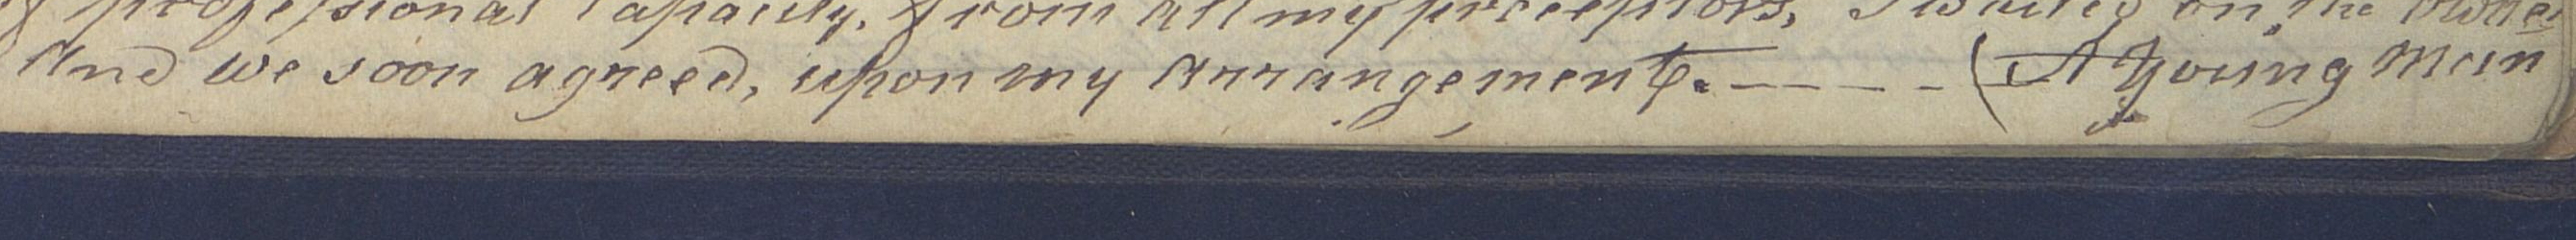and we soon agreed, upon any arrangement. (A Young Man
